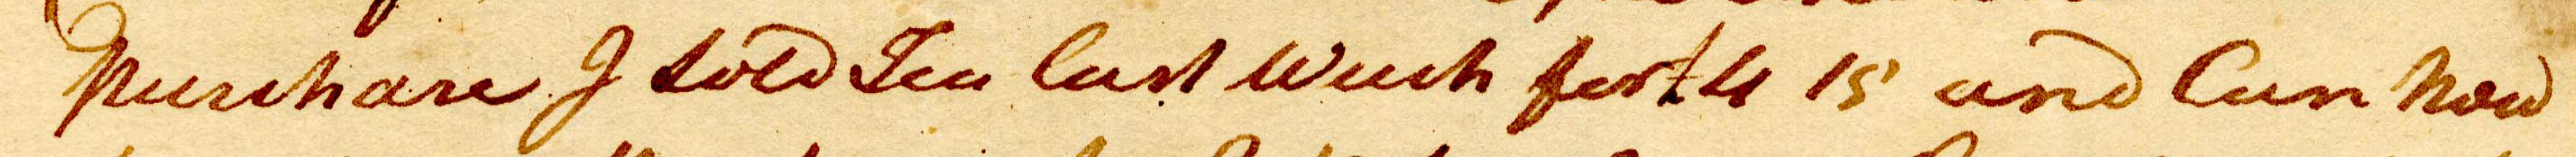Purchase I sold Tea last week for £4 15s and can now
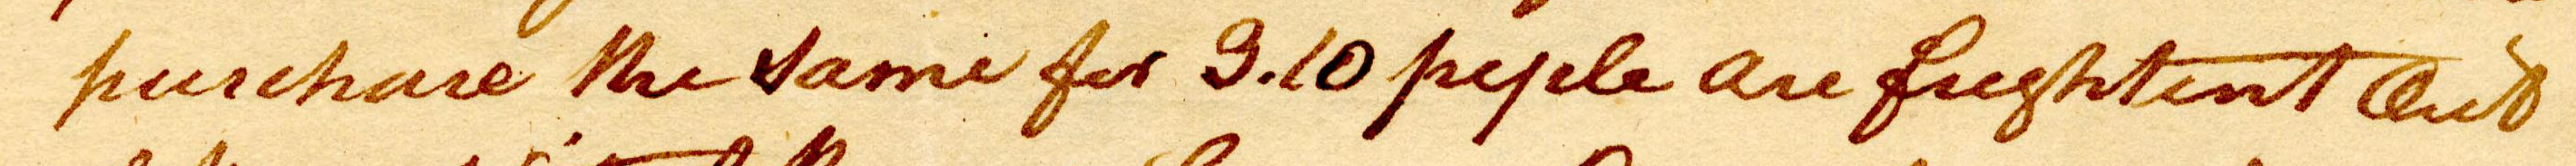purchase the same for 3.10 peple are frightent and
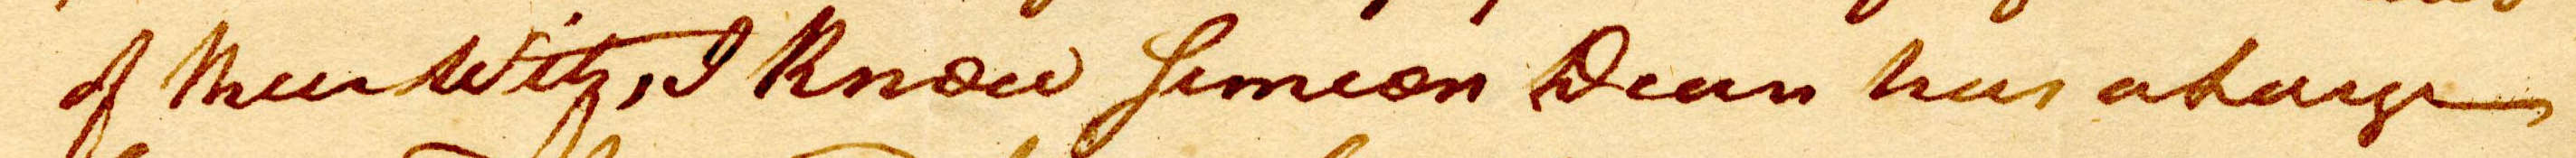of their witz, I know Simon Dean has a Large
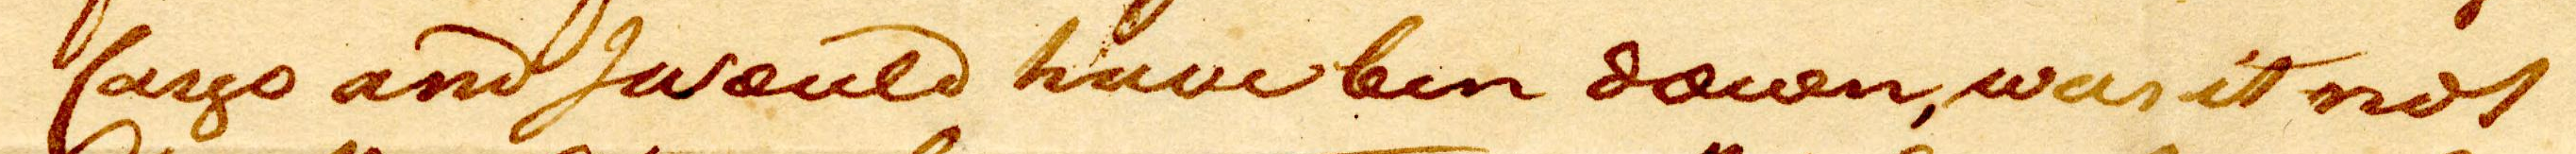Cargo and I would have ben down, was it not
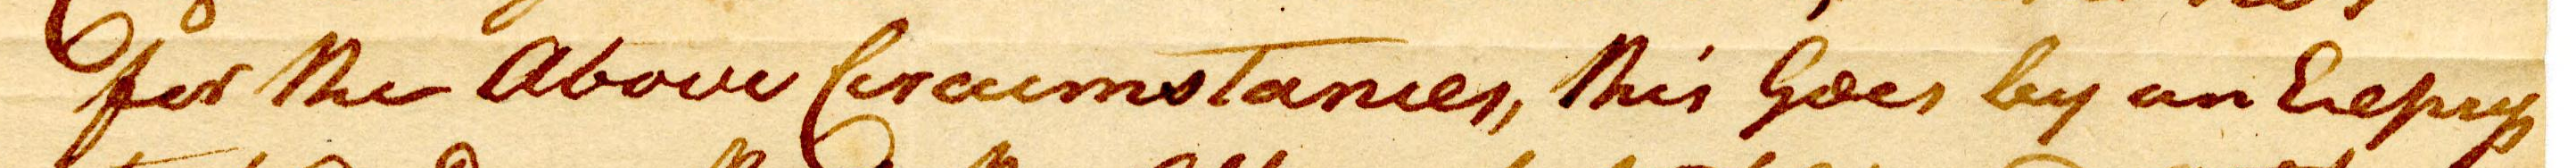for the above Circumstances, this Goes by an Express
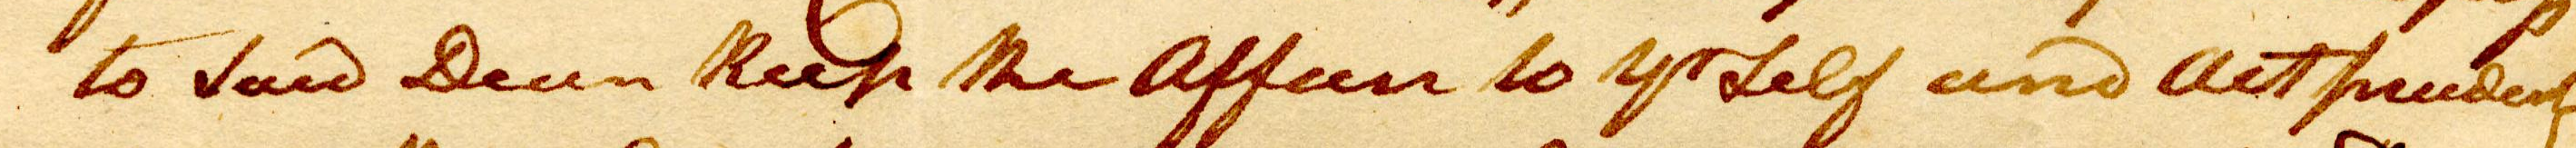to said Dean Keep the Affair to y^r self and Act precedens
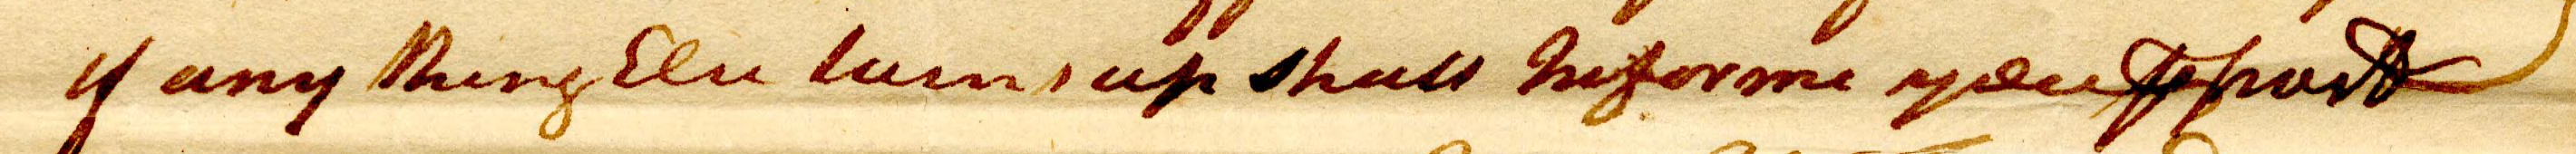of any thing Else turns up shall informe you per post
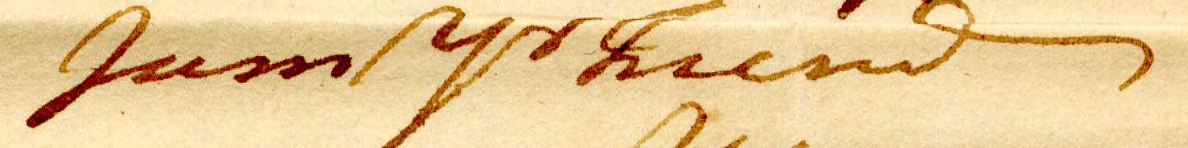I am y^r Friend
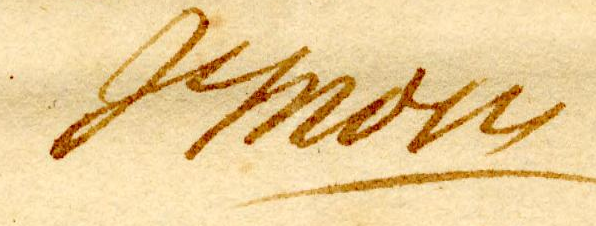I Moses
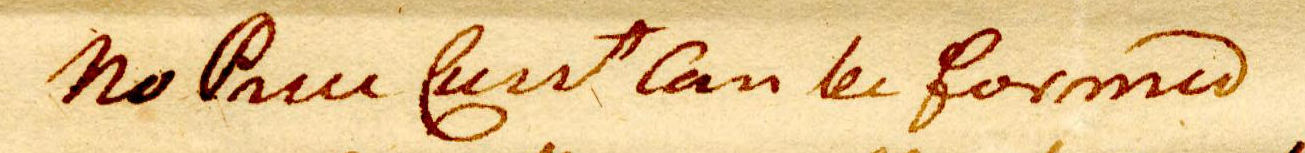no Price Curr^t can be formed
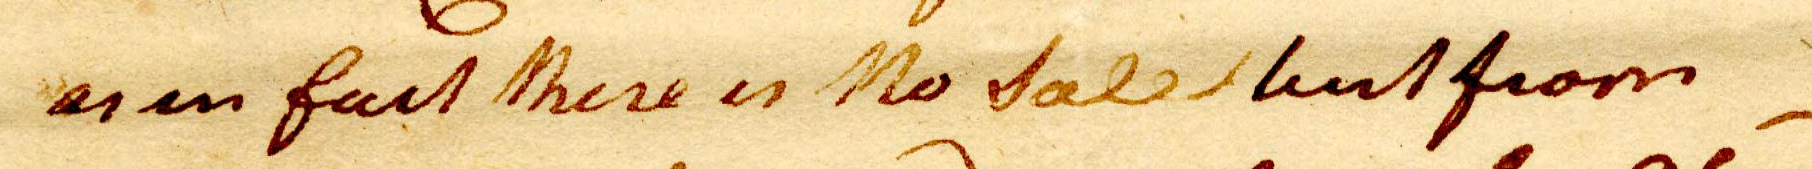as in fact there is no sale but from
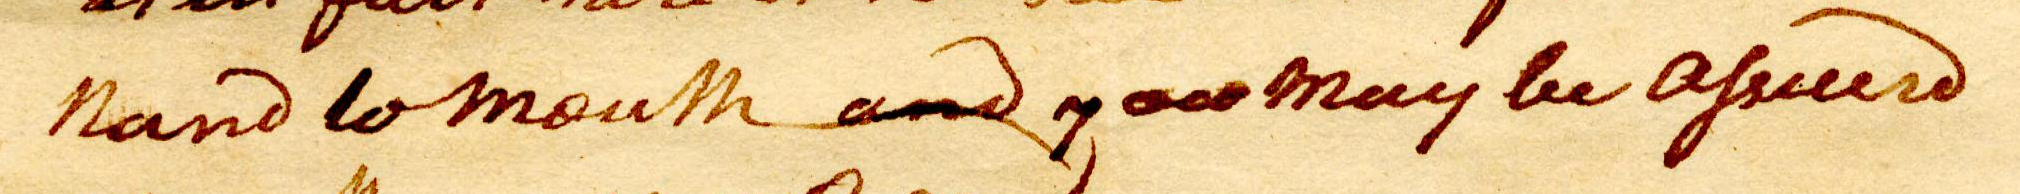hand to mouth and you may be assuerd
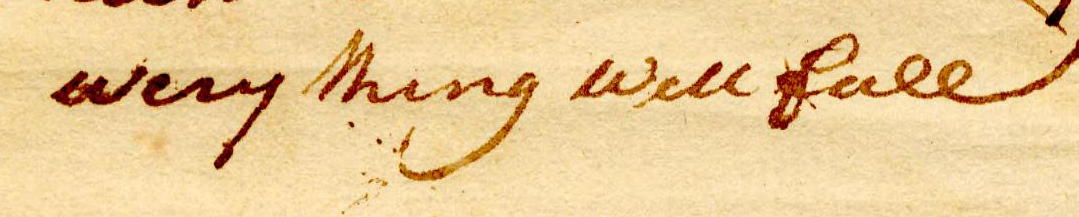every thing will fall
